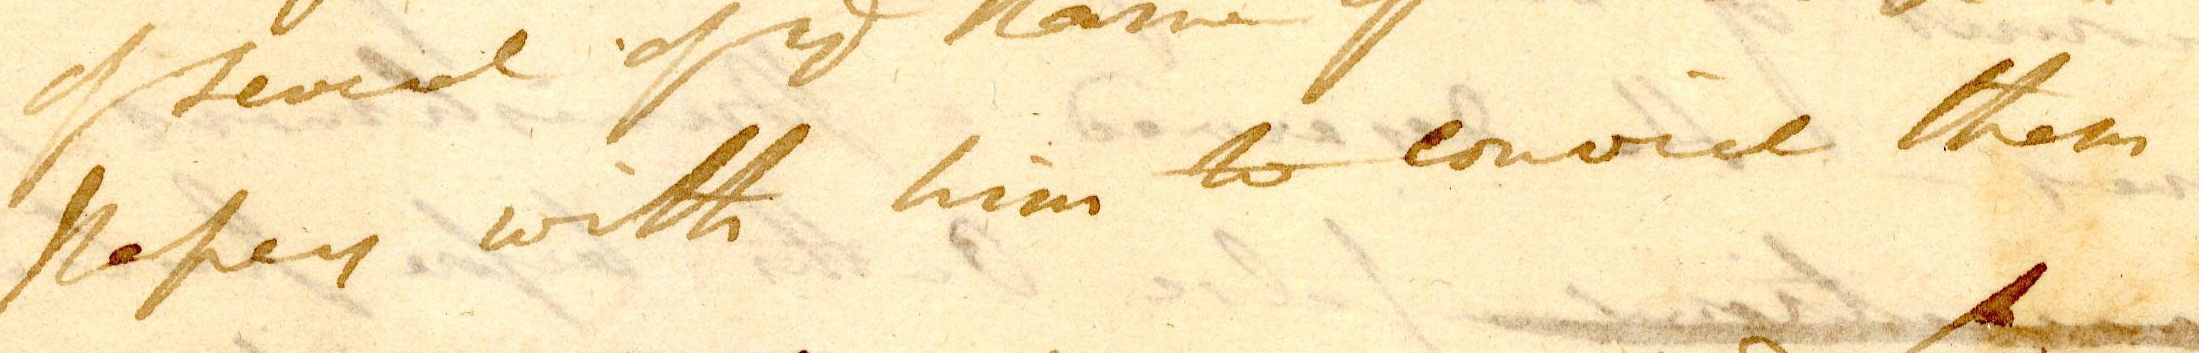papers with him to convict them.
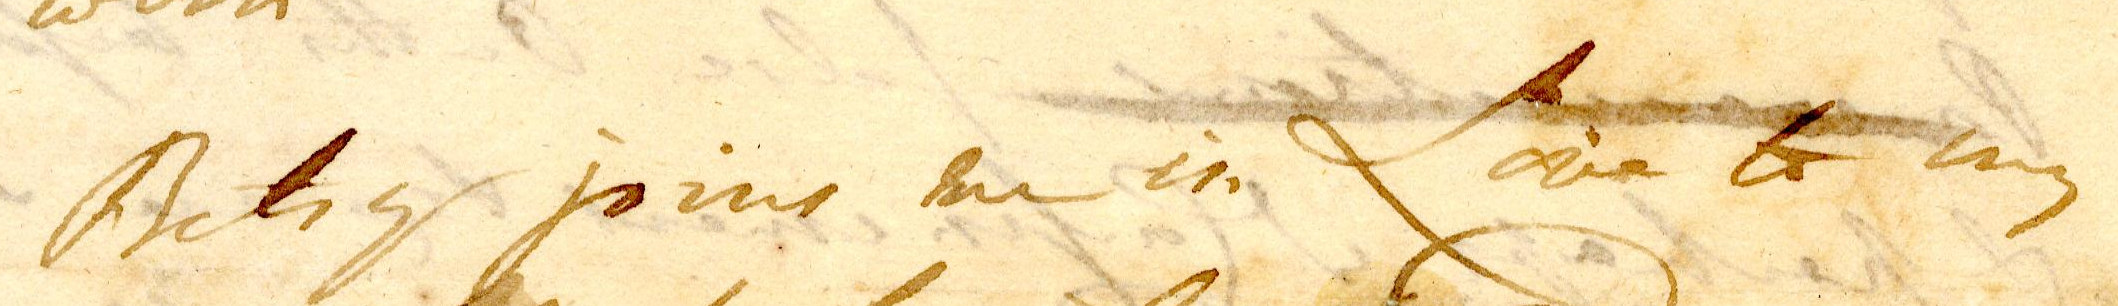Betsy joins me in Love to my
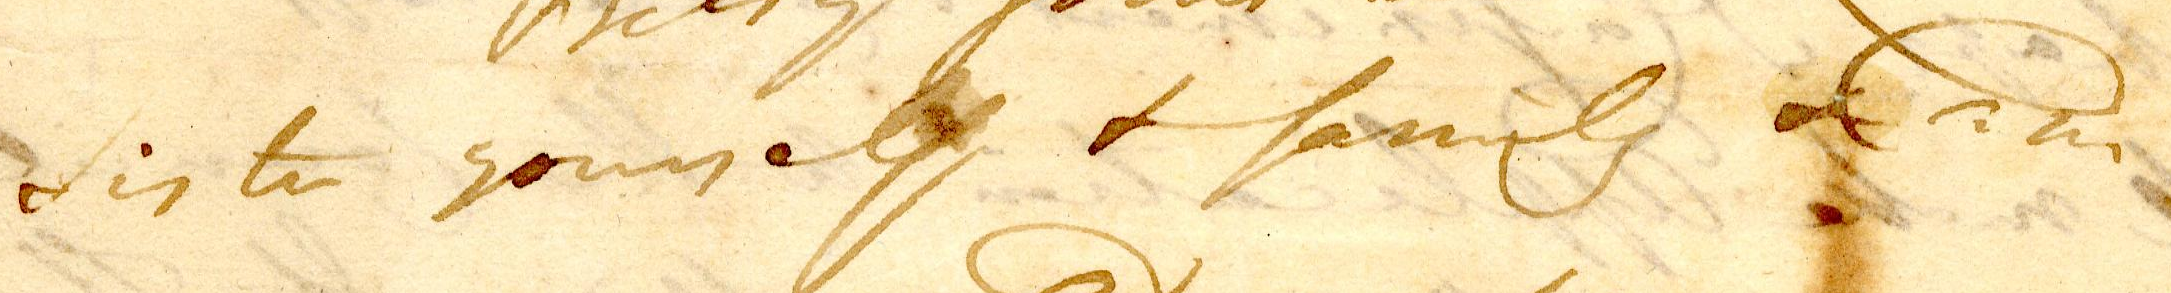sister yourself & family. I am
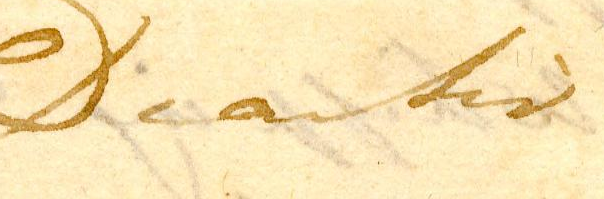Dear Sir
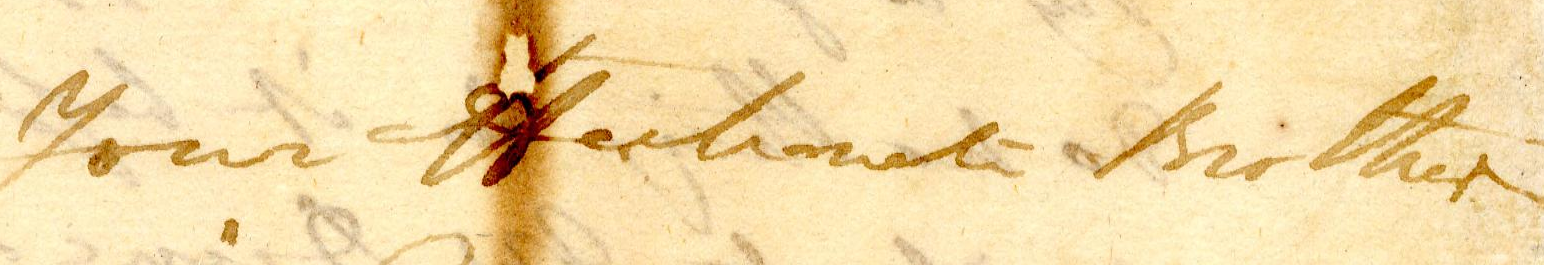Your affectionate Brother
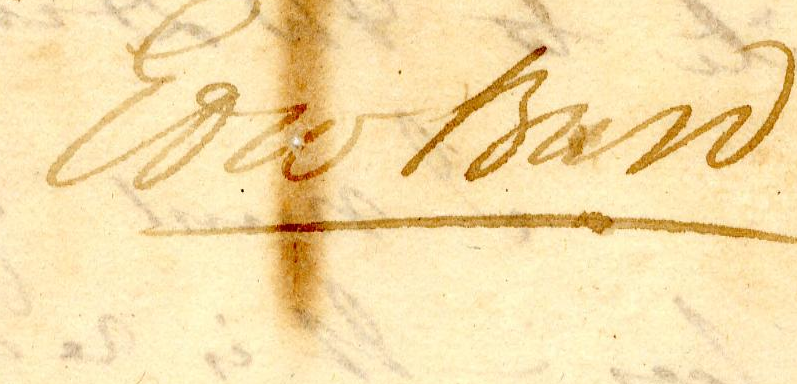Edw Burd
